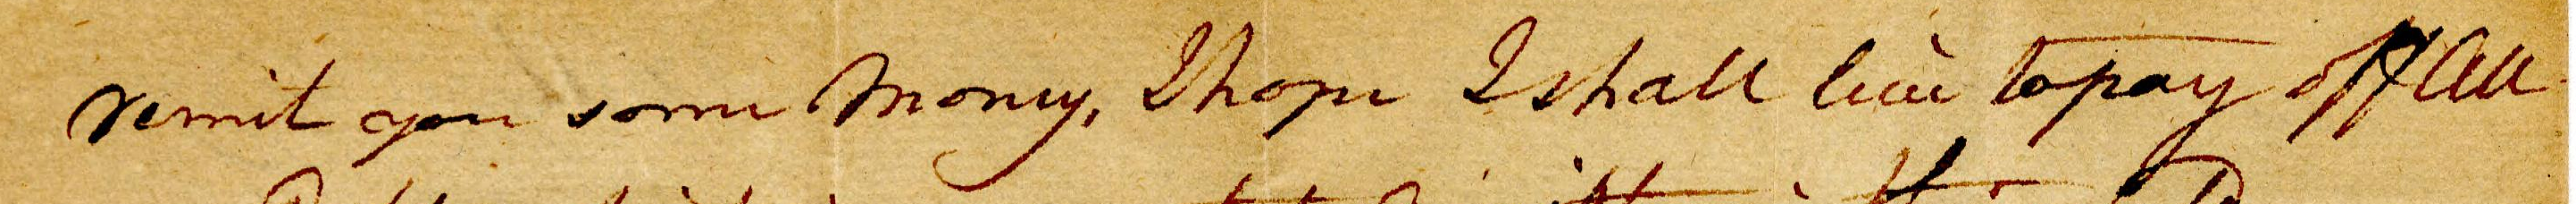remit you some money, I hope I shall live to pay off all
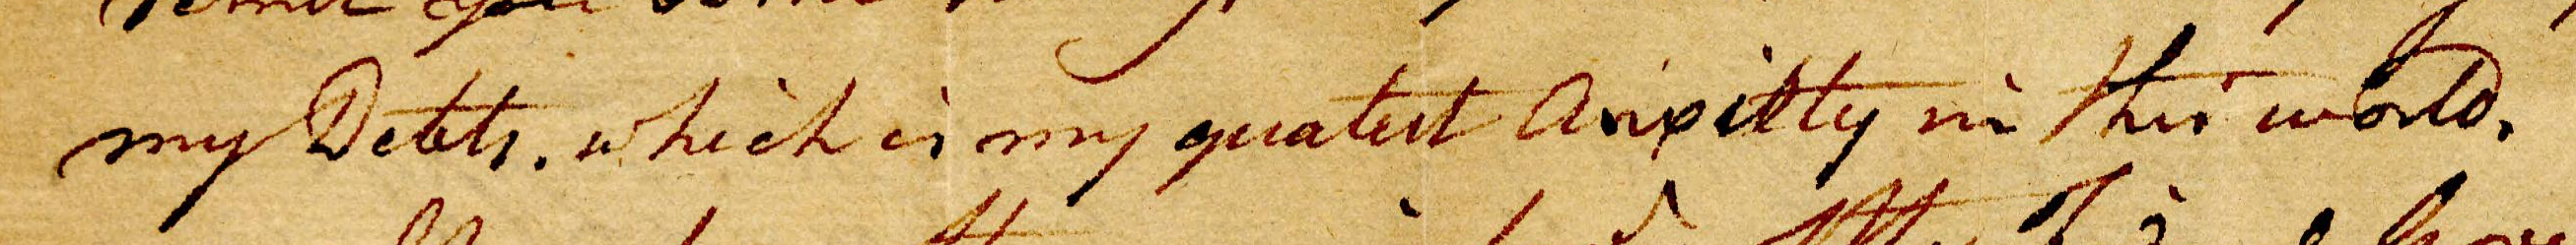my Debts which is my greatest Anxiety in this world.
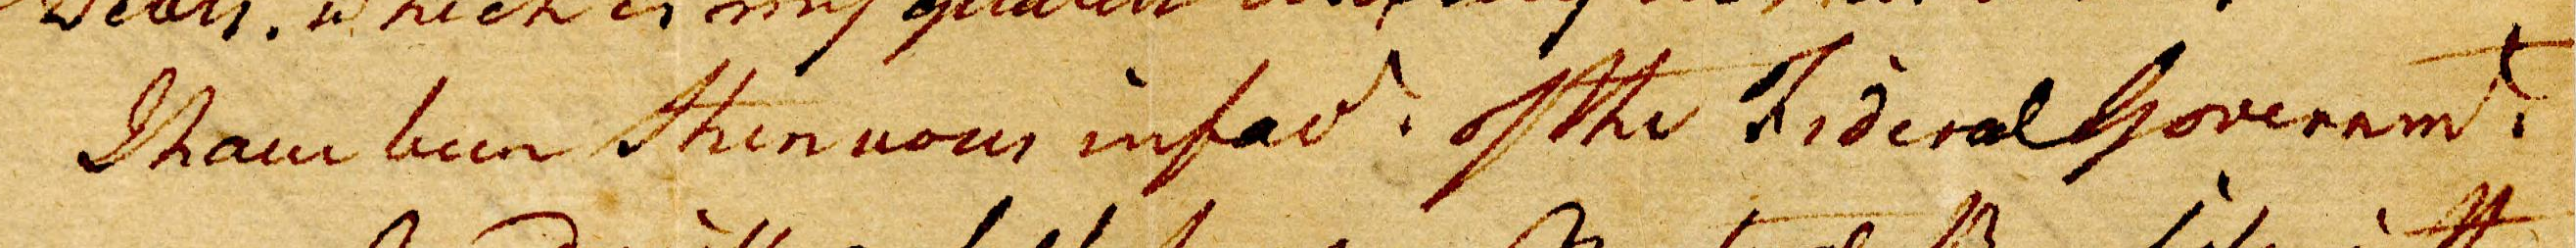I have been Strenuous in fav^r of the Federal Governm^t.
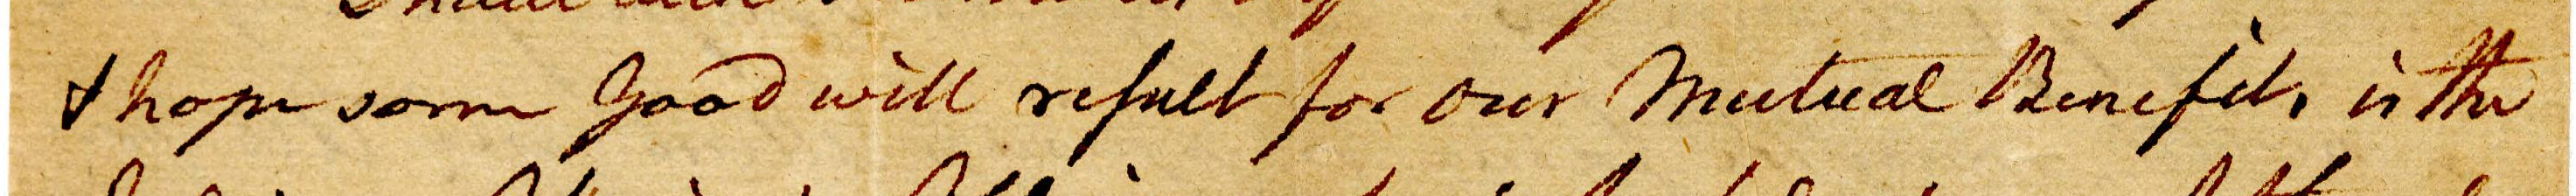& hope some good will result for our mutual Benefit, in the
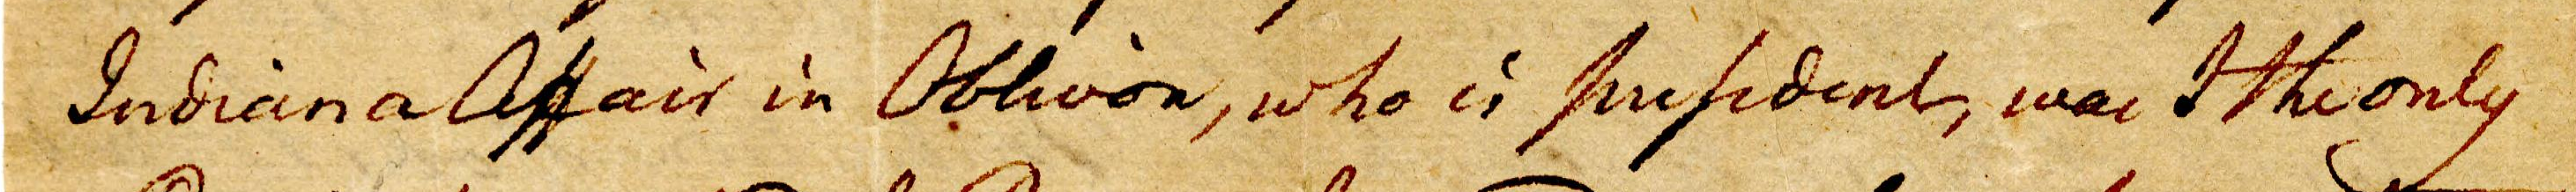Indiana Affair in Oblivon, who is president, was I the only
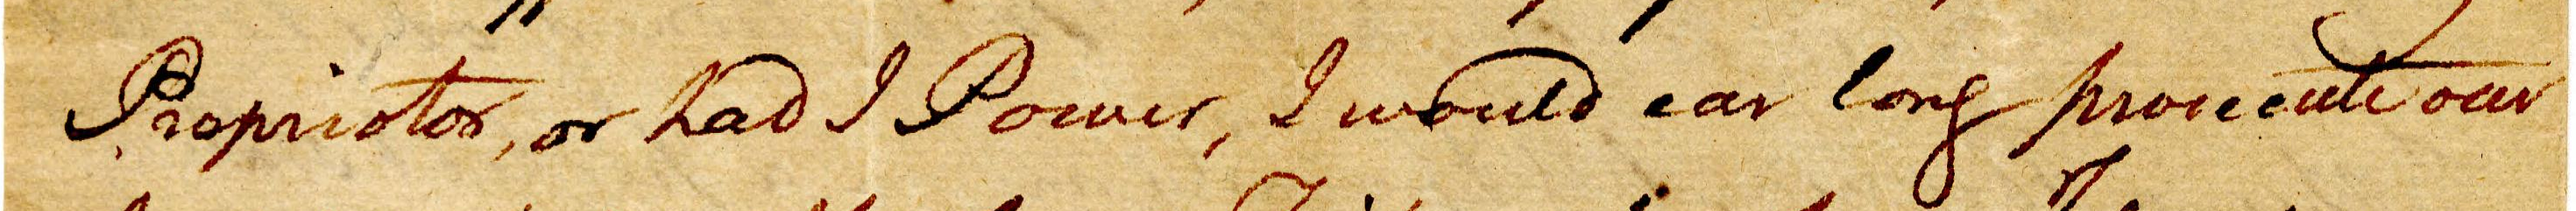Proprietor, or had I Power, I would ear long prosecute our
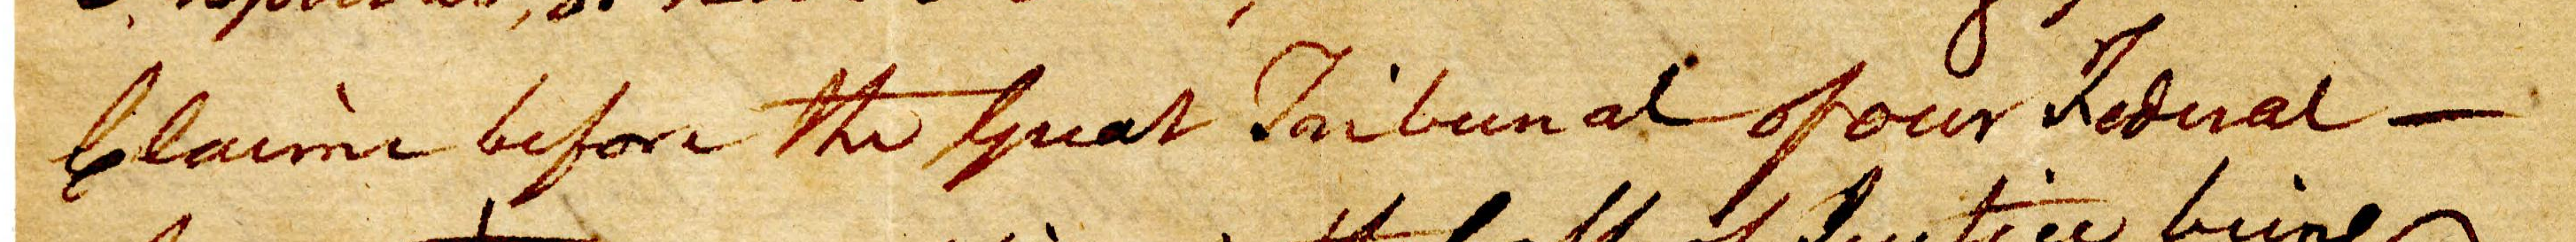Claims before the Great Tribunal of our Federal-
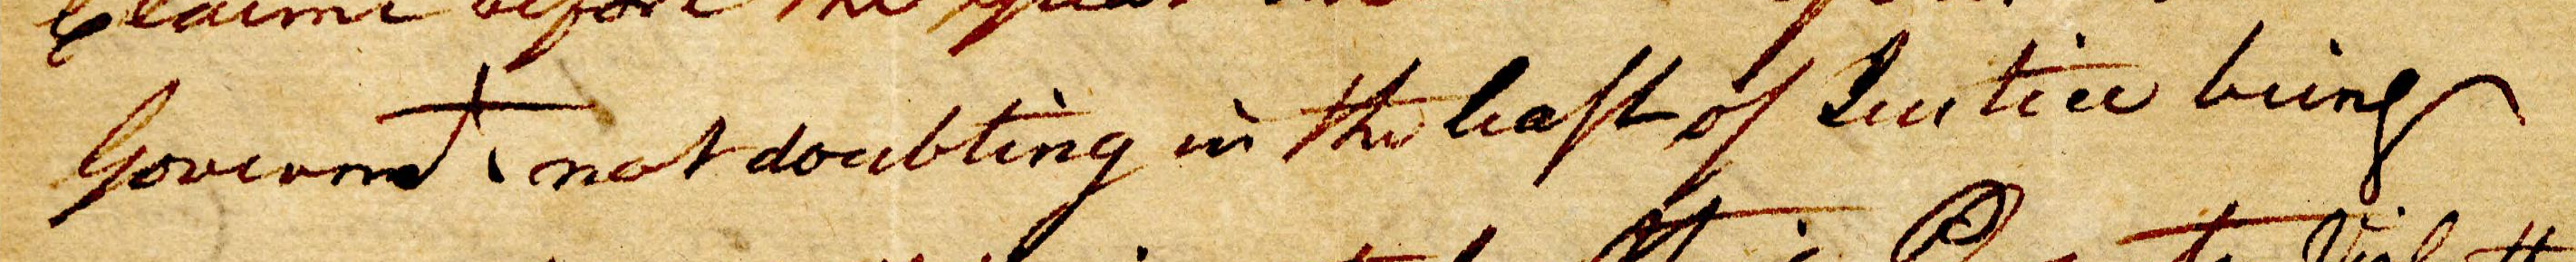Governm^t not doubting in the least of justice being
